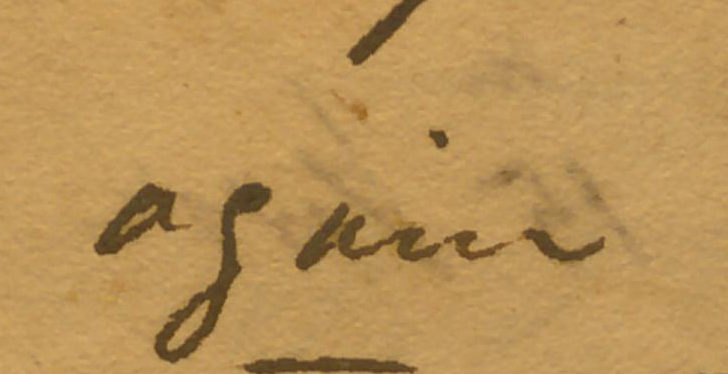again
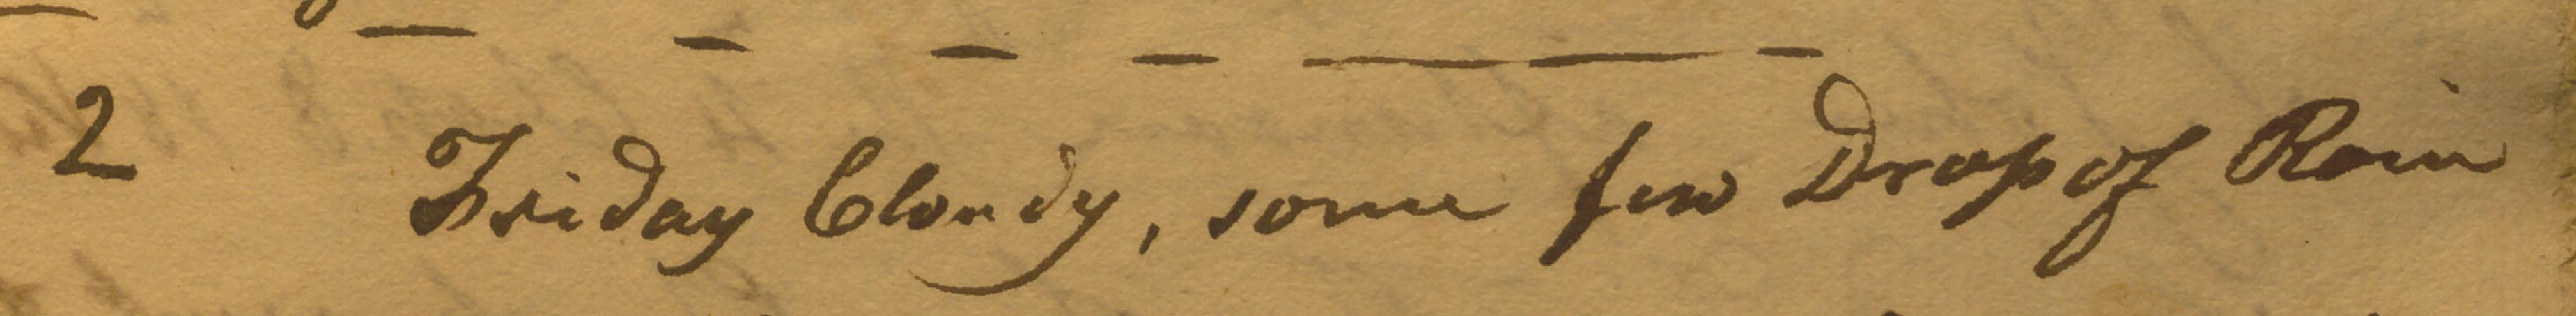2 Friday Cloudy, some few Drop of Rain
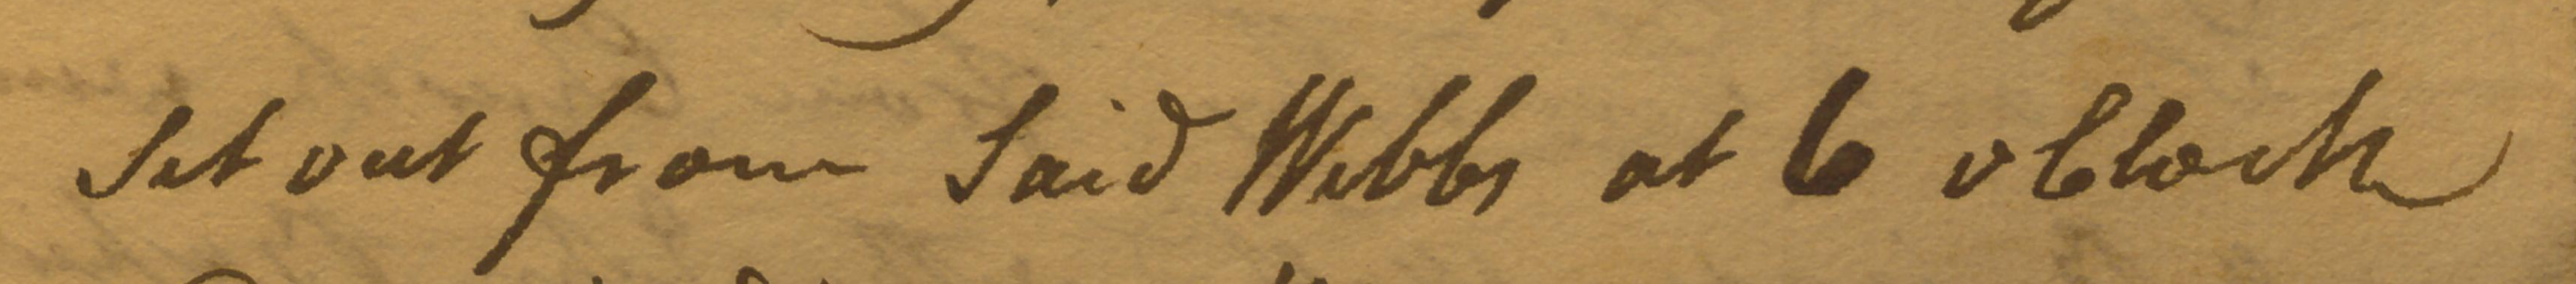set out from Said Webbs at 6 oClock
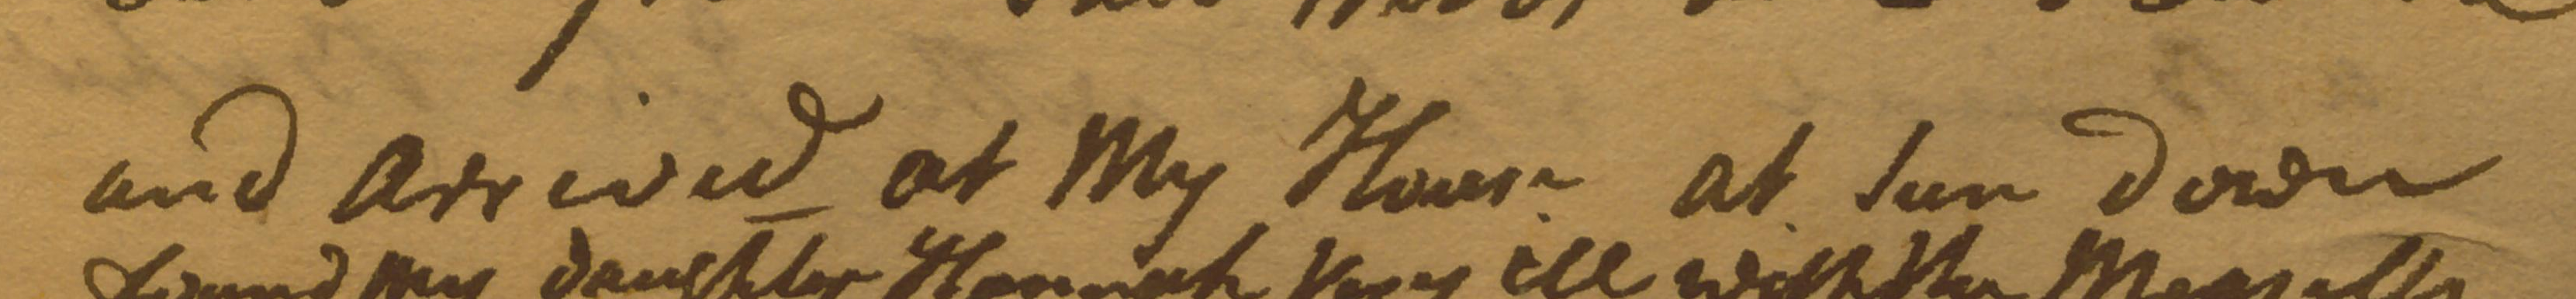and arrived at My House at sun down
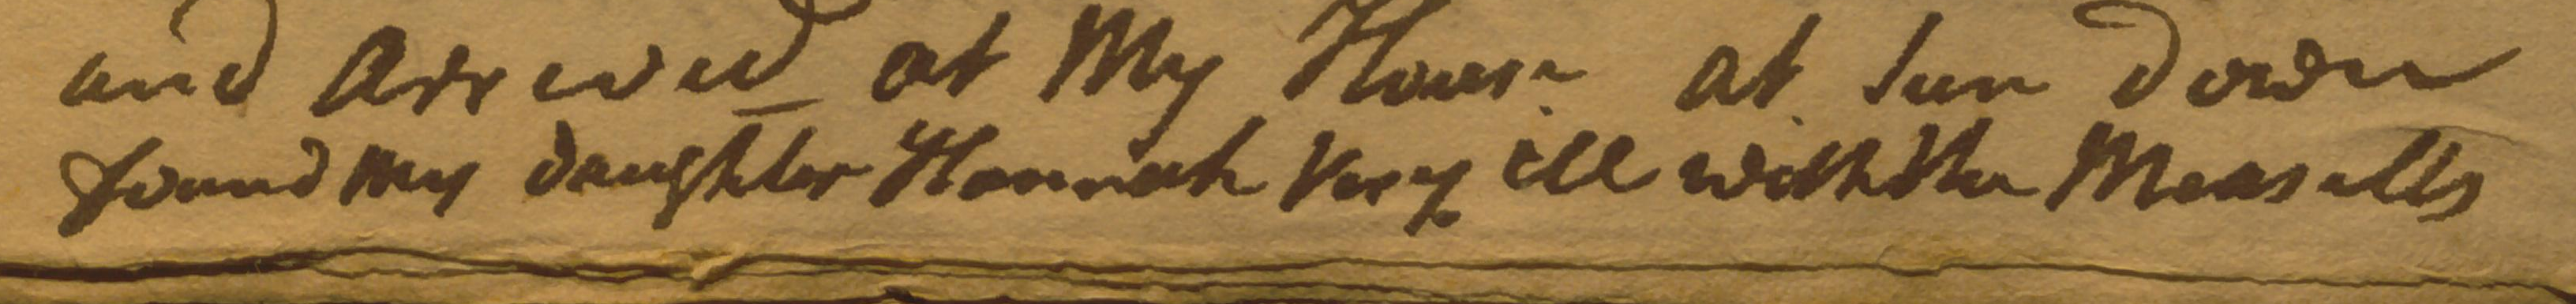found my daughter Hannah Very ill with the Measells
